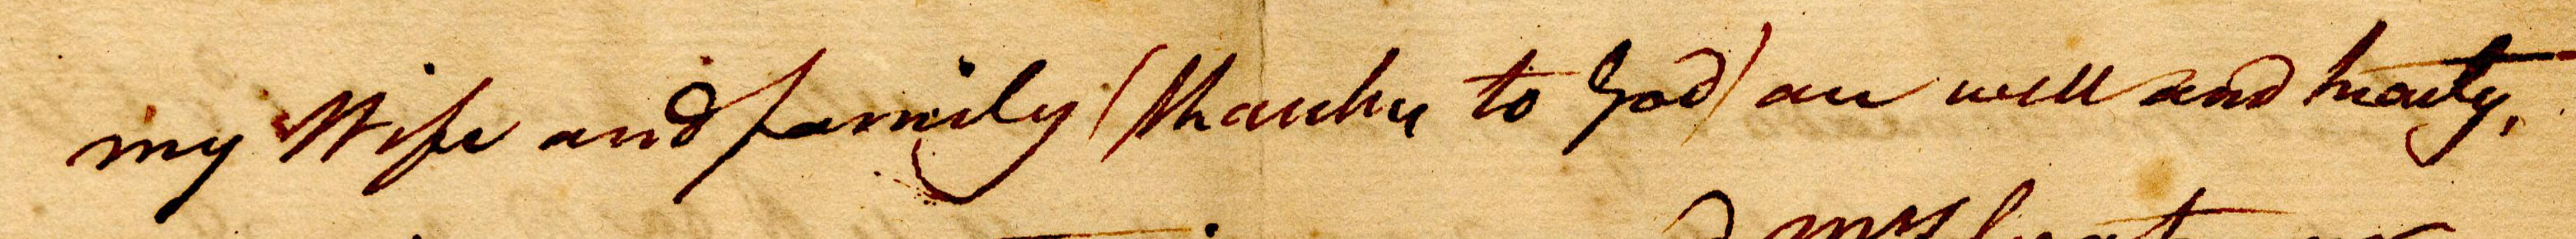my Wife and family thankes to god are well and hearty,
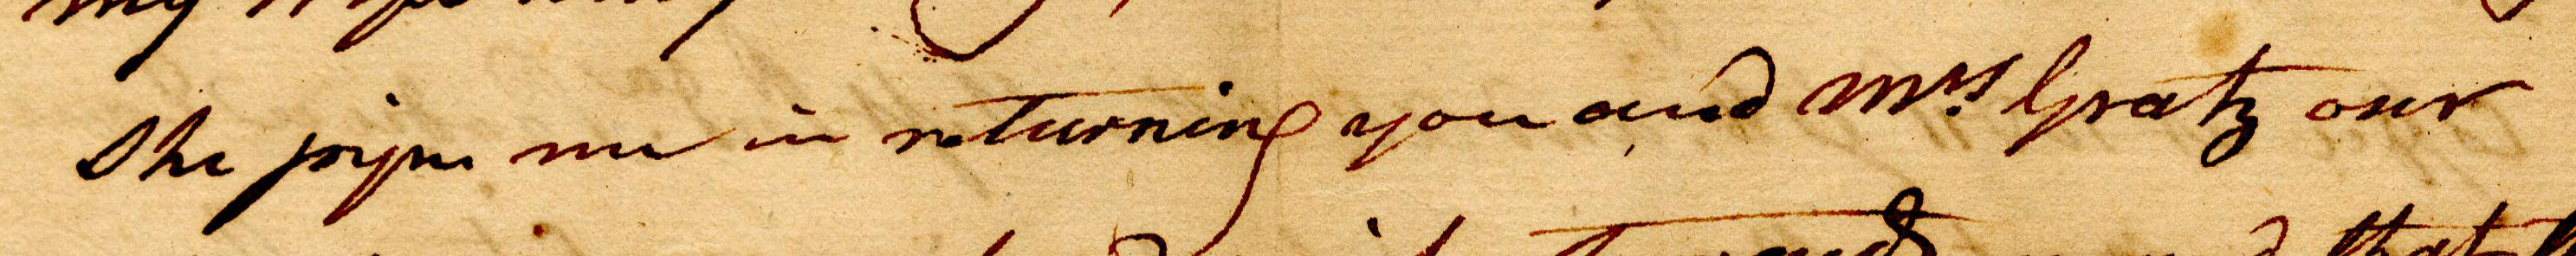she joyns me in returning you and M^rs Gratz our
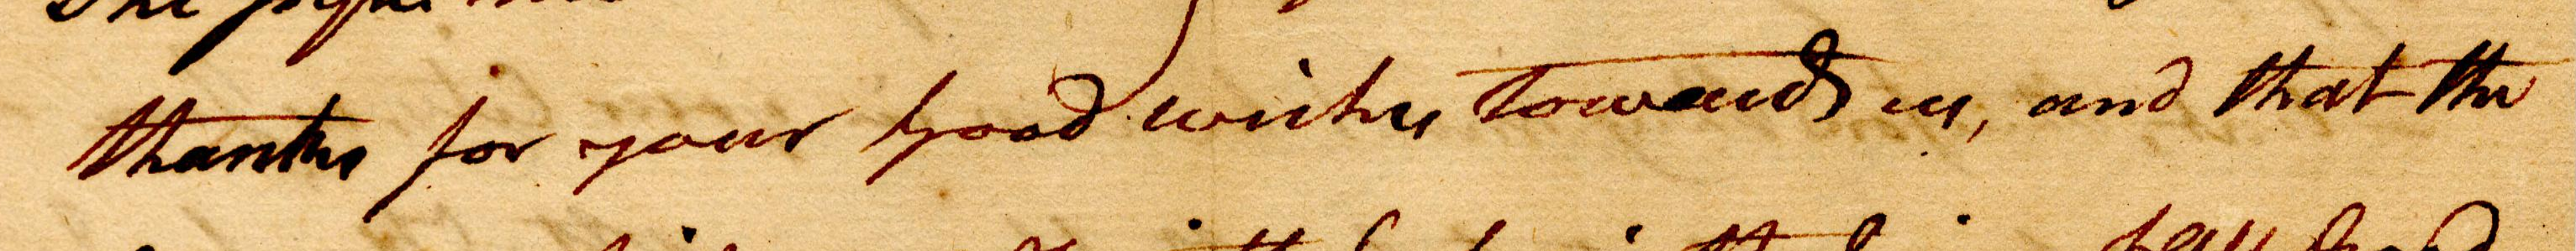thanks for your Good wishes towards us, and that the
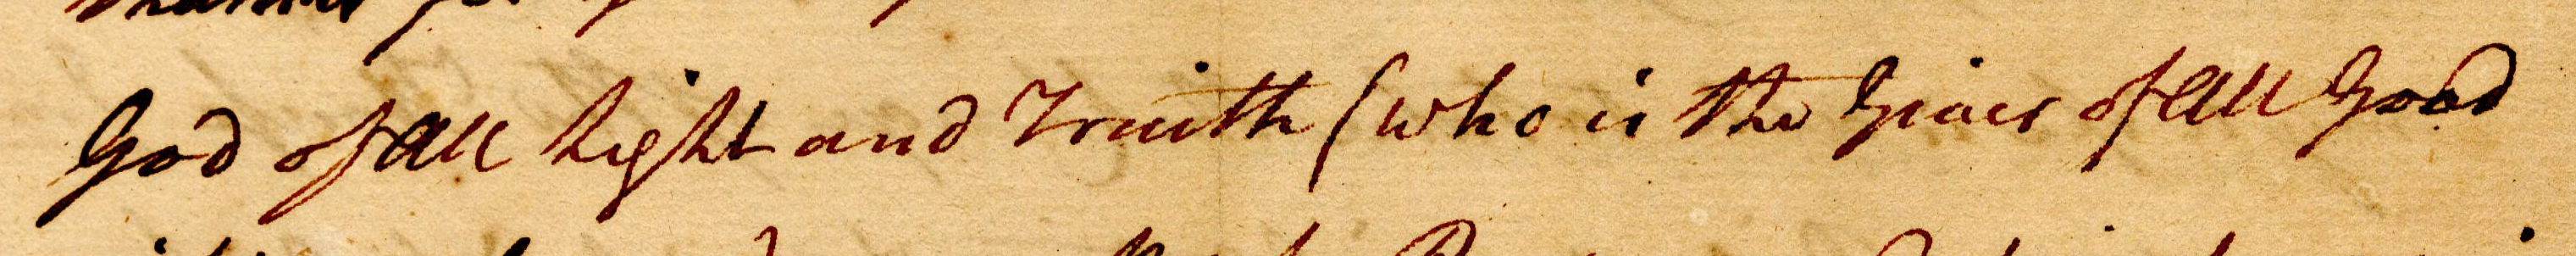God of All Light and Truith (who is the Giver of All Good
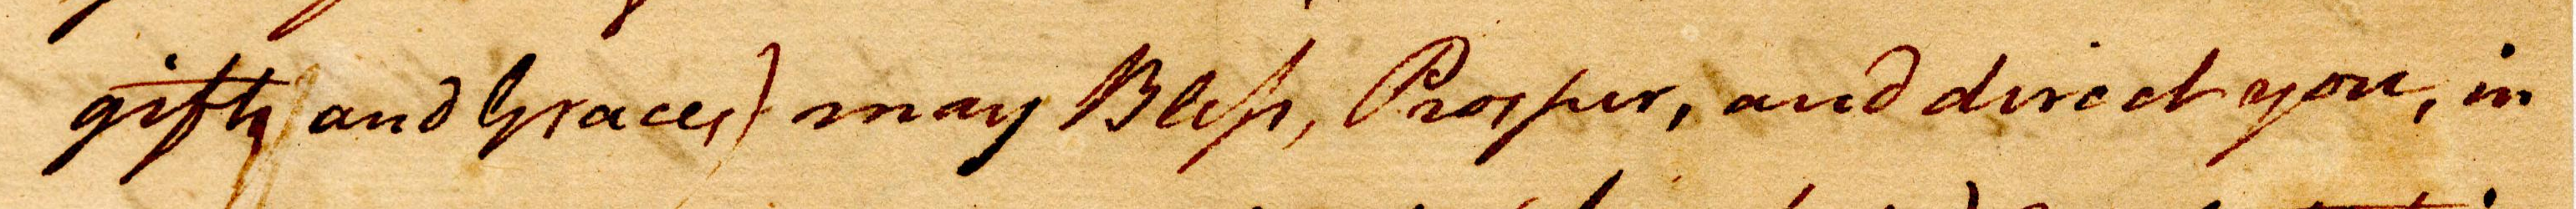gifts and Graces) may Bless, Prosper, and direct you, in
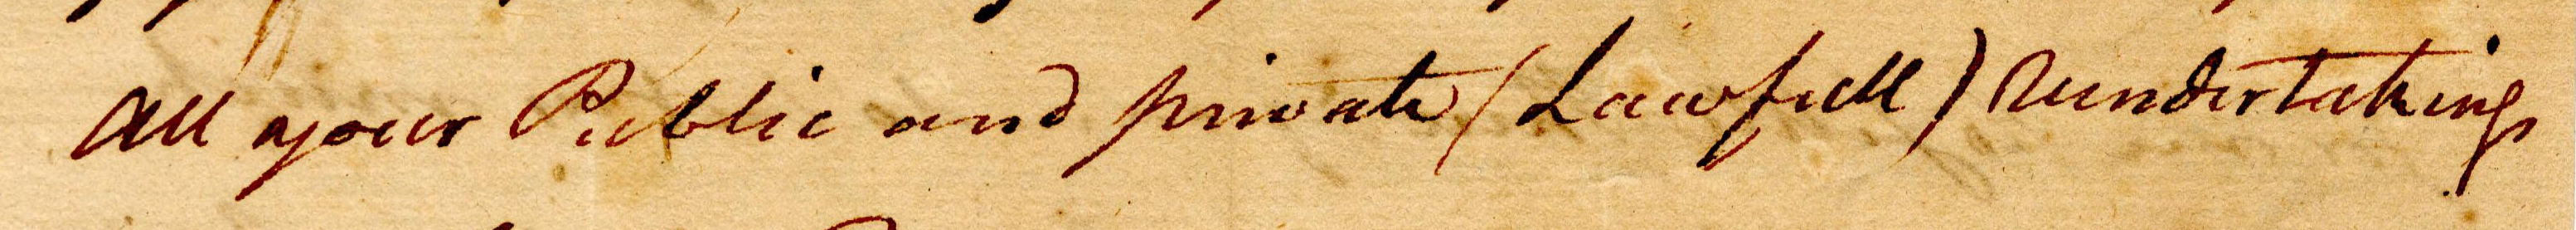All your Public and Private/Lawfull) undertaking
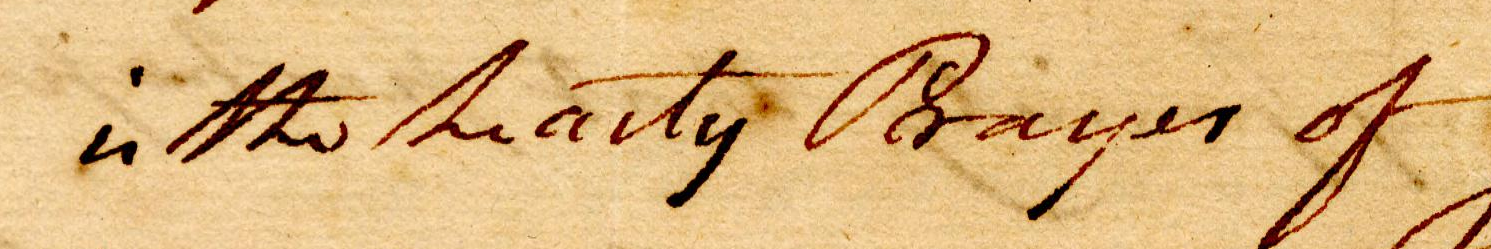in the hearty Prayers of
